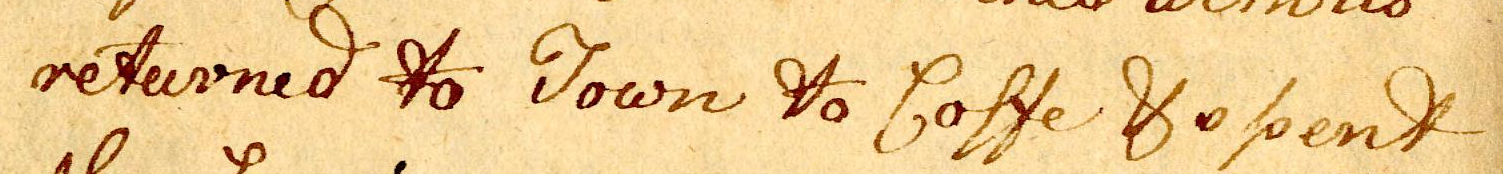returned to Town to Coffe & spent
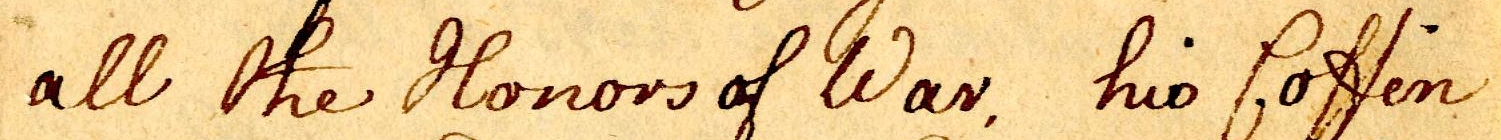all the Honors of War, his Coffin
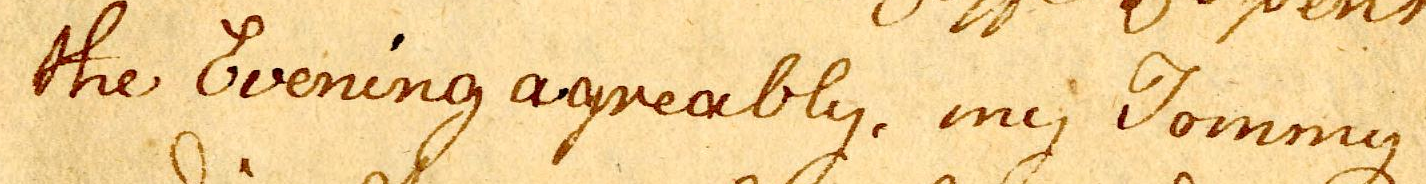the Evening agreably, my Tommy
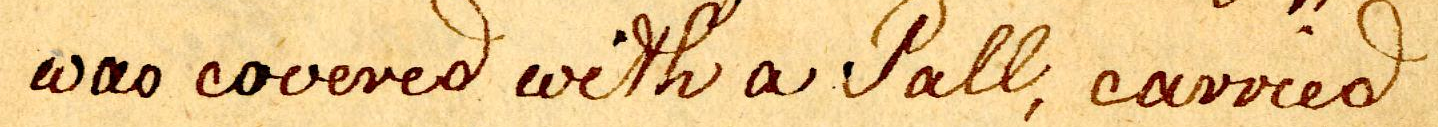was covered with a Pall, carried
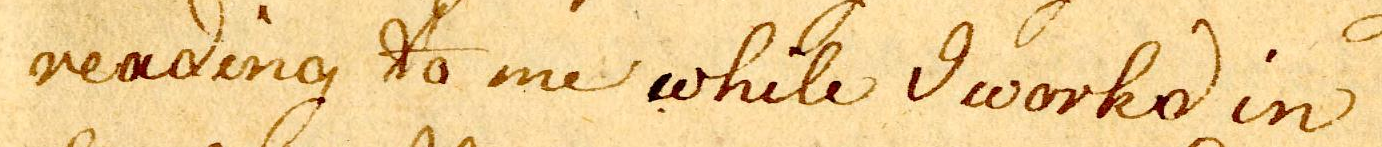reading to me while I workd in
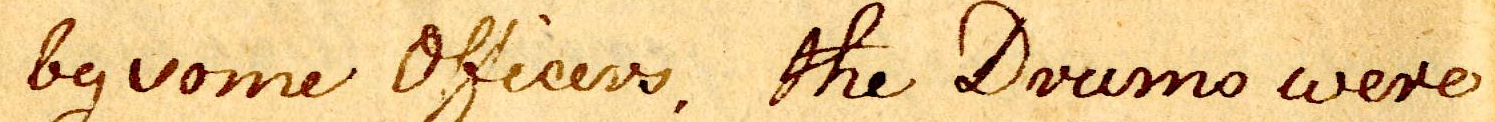by some Officers, the Drums were
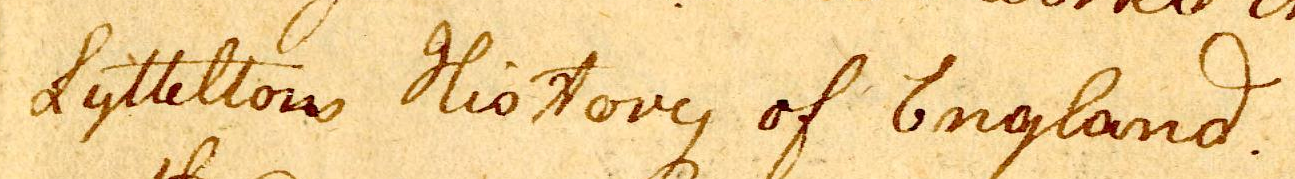Lyttletons History of England
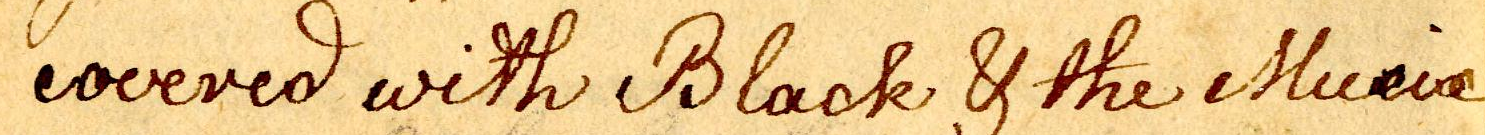covered with Black & the Music
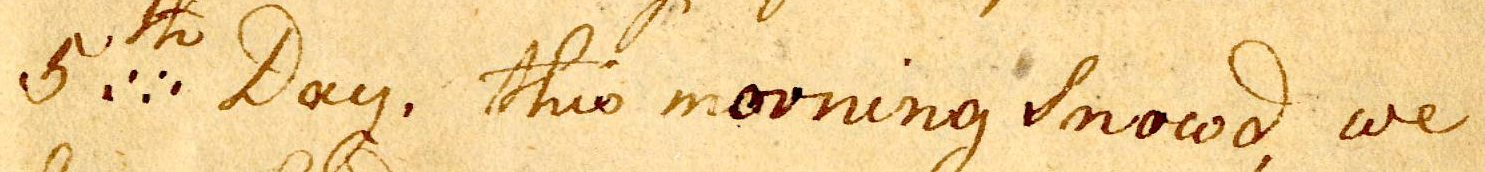5^th Day, this morning Snowd, we
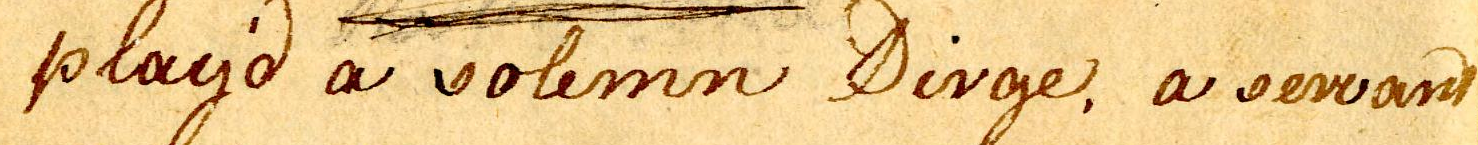play'd a solemn Dirge, a servant
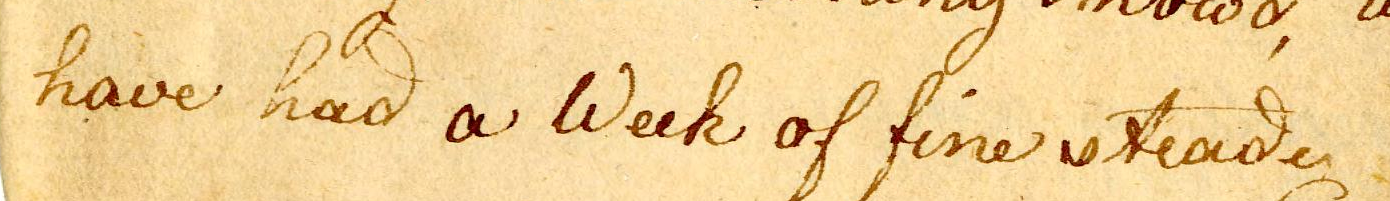have had a Week of fine steady
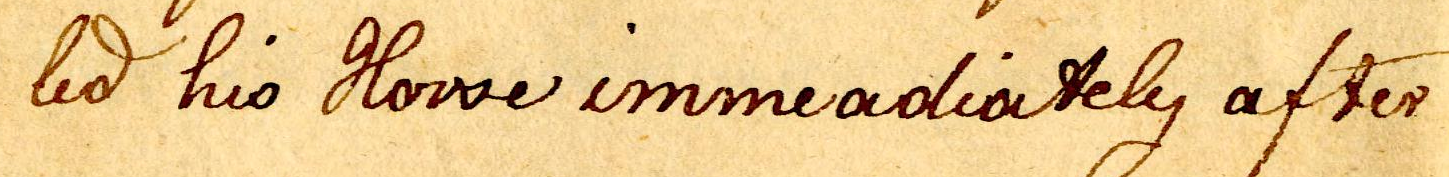led his Horse immediately after
